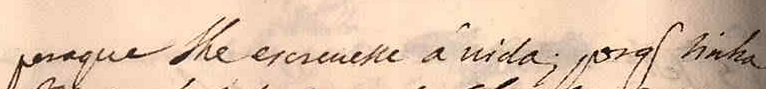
pera que lhe escreuesse á uida; porq̄ tinha
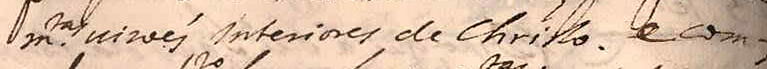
m.tas uizoẽs interiores de Christo; E com
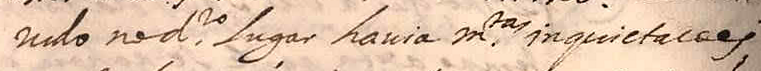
tudo no d.to Lugar hauia m.tas inquietaçoẽs,
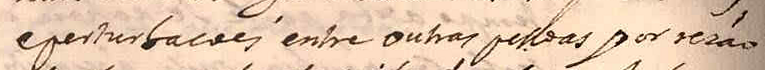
e perturbaçoẽs, entre outras pessoas por rezaõ
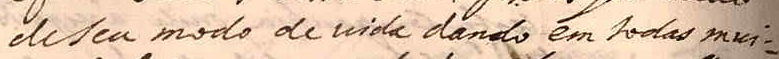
de seu modo de uida dando em todas mui
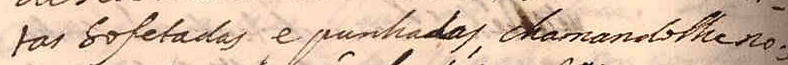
tas bofetadas, e punhadas chamandolhe no
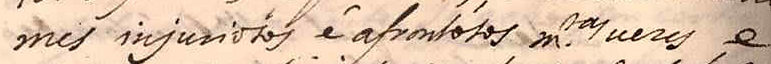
mes injuriosos, e afrontosos m.tas uezes, e
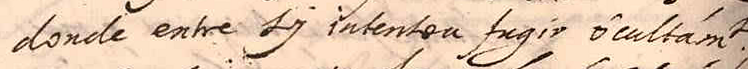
donde entre sy intentou fugir ócultamte.
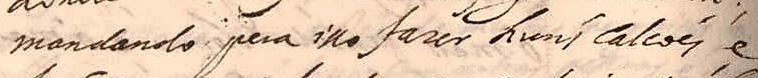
mandando pera isso fazer huns calçoẽs e
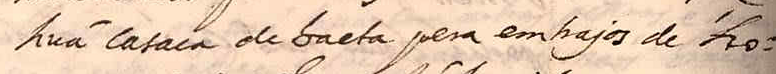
huā casaca de baeta pera em trajos de ho
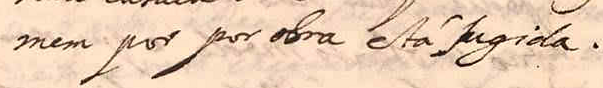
mem por por obra está fugida.
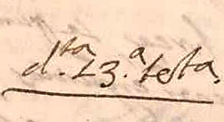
d.ta 13.a testa
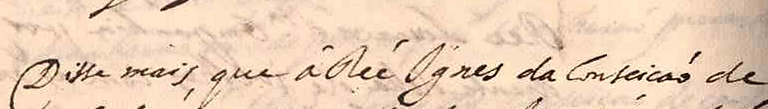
Disse mais, que á Reé Ignes da Conseiçaõ de
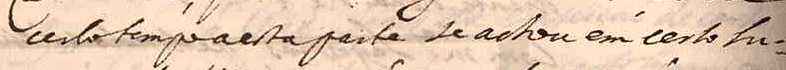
certo tempo a esta parte se achou em certo Lu
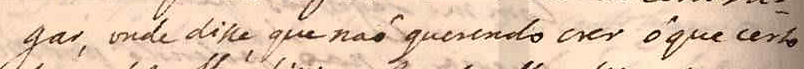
gar, onde disse, que naõ querendo crer ô que certo
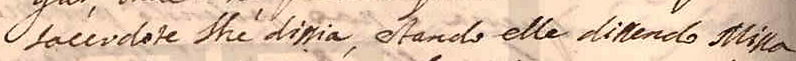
sacerdote lhe dissia, estando elle dissendo Missa
